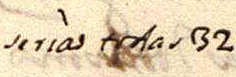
serião todas 32
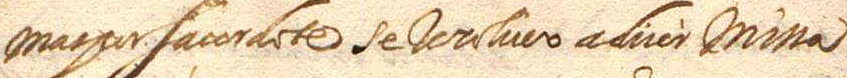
mas por sacerdote se Rezolueo a dizer missa
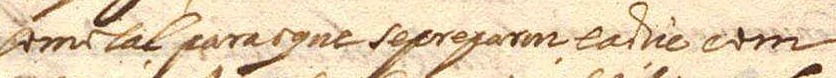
como tal, para o que se preparou, e a diçe com
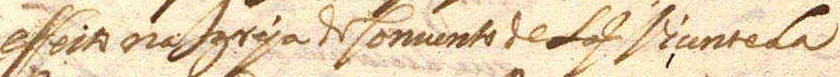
effeito na Igreja do Conuento de Saõ Viçente da
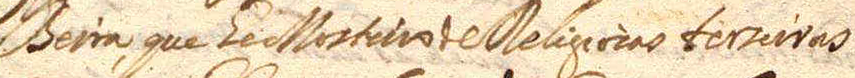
Beira, que he Mosteiro de Religiozas terseiras
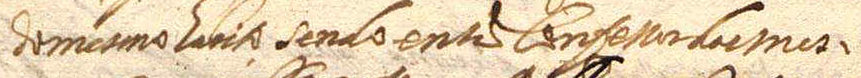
do mesmo habito, sendo entaõ Confessor das mes
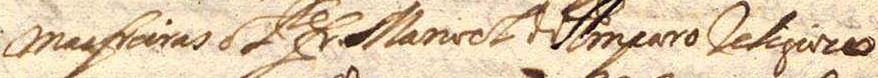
mas freiras o Pe fr. ManoeL do Amparo Religiozo
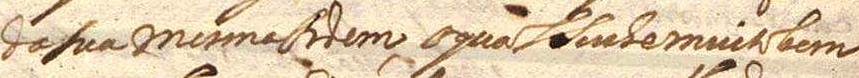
da sua mesma Ordem, o qual soube muito bem
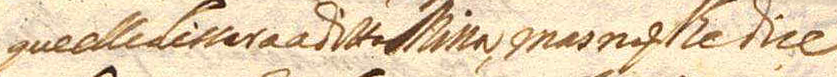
que elle dissera a ditta Missa, mas naõ lhe diçe
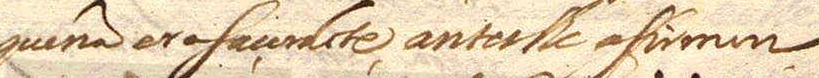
que não era saçerdote, antes lhe affirmou
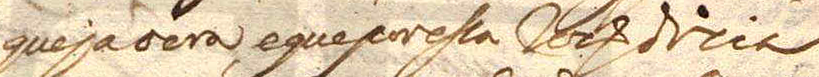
que ja o era, e que por essa Rezaõ dizia
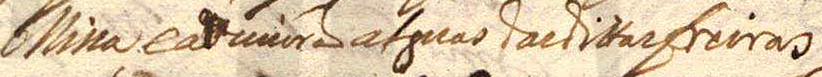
Missa, e a _uuirão alguas das dittas freiras
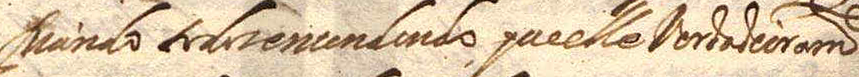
ficando todos entendendo, que elle verdadeiramte
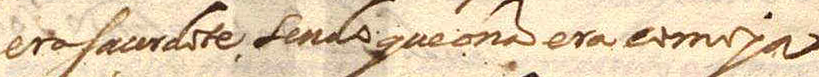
era saçerdote, sendo que o não era como ja
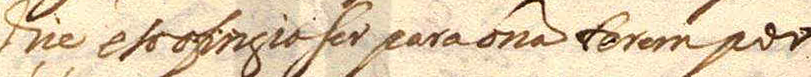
diçe, e so o fingio ser para o não terem por
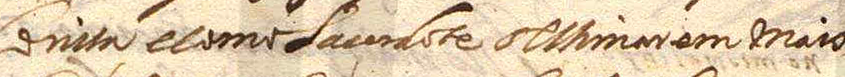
Corista, e como Saçerdote o estimarem mais
